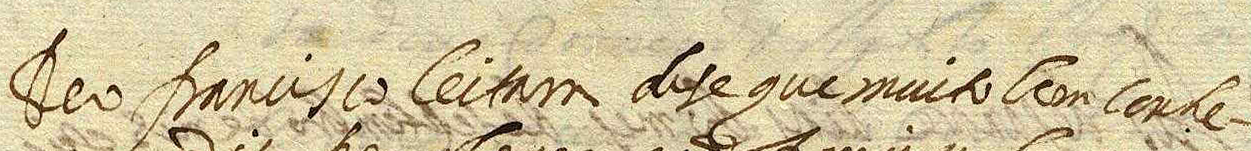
Reo francisco leitam dise que muito bem conhe
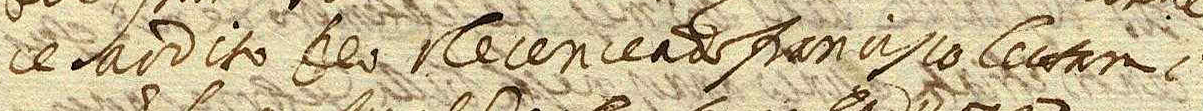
ce ao dito Reo o lecenceado francisco leitam o
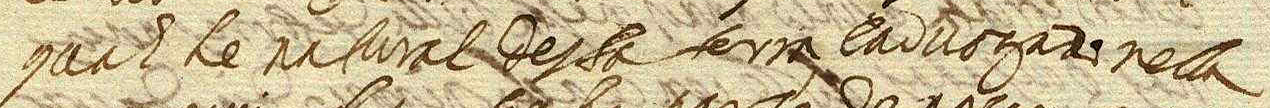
qual he natural desta terra e aduogado nella
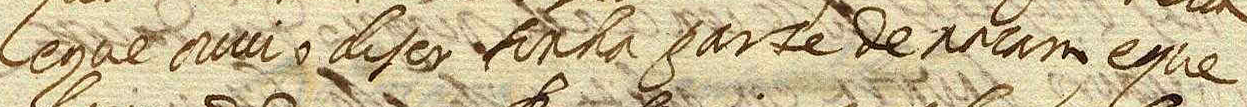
e que ouuio diser tinha parte de naçam, e que
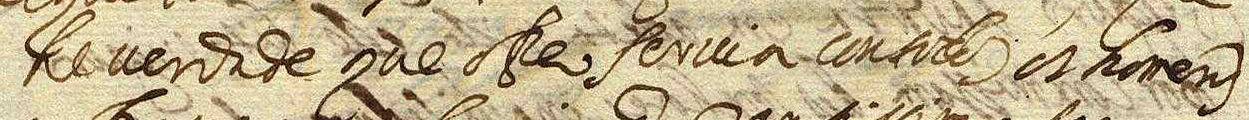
he uerdade que o Reo seruia com todos os homens
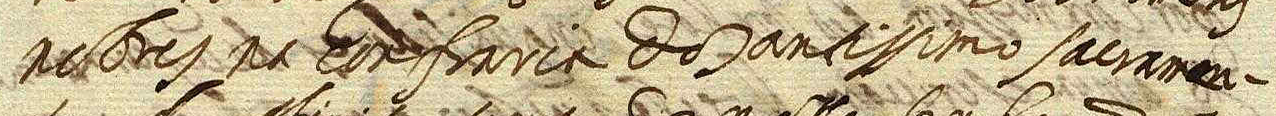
nobres na confraria do santissimo sacramen
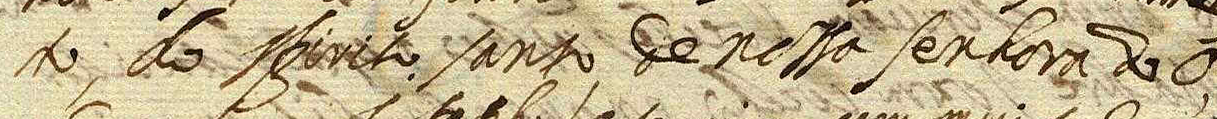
to, do spirito santo, de nossa senhora do Ó,
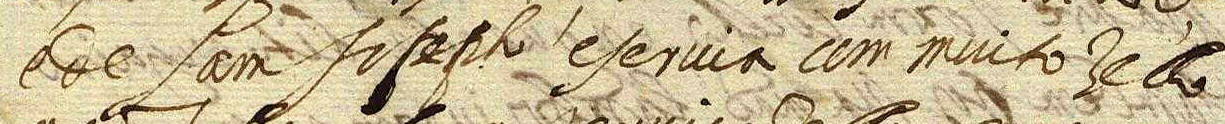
e de sam joseph e seruia com muito zello
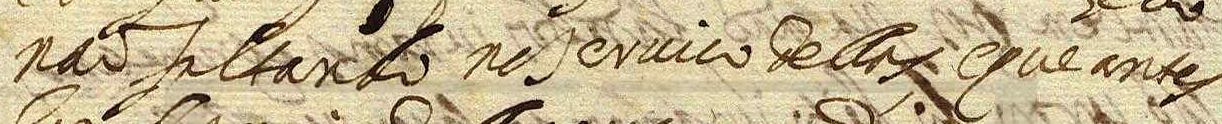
naõ faltando no seruiço dellas, e que antes
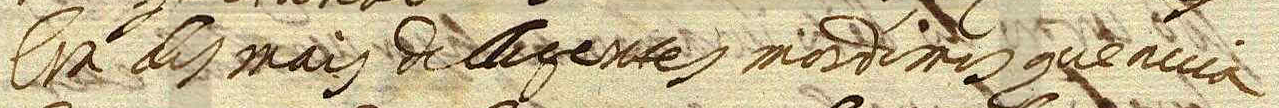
era dos mais delligentes mordomos que auia
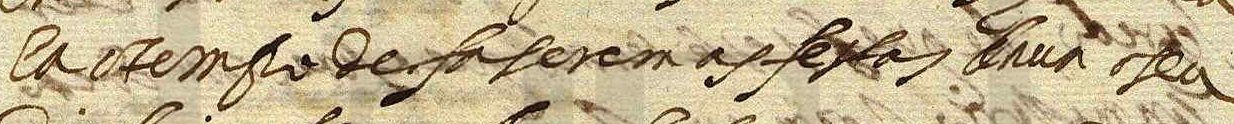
e ao tempo de faserem as festas daua o seu
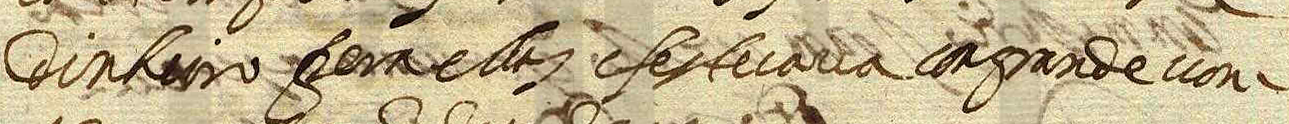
dinheiro pera ellas e festeiaua con grande uon
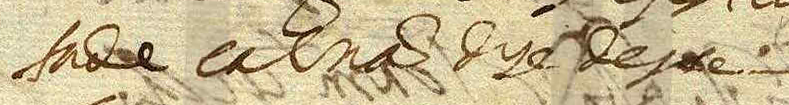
tade e al naõ dise deste
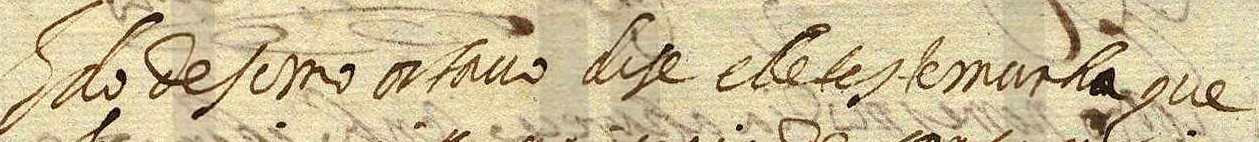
E do desimo oitauo dise elle testemunha que
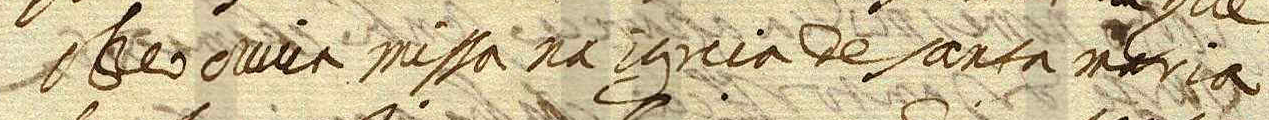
o Reo ouuia missa na igreia de santa maria
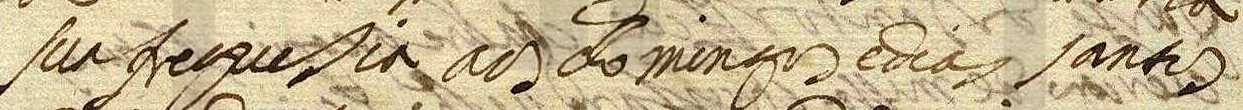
sua freguesia aos domingos e dias santos
